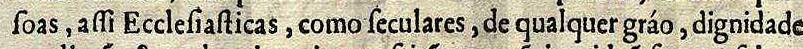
soas, assi Ecclesiasticas, como seculares, de qualquer gráo, dignidade
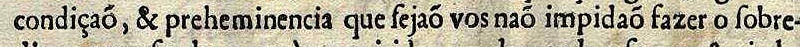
condiçaõ, & preheminencia que sejaõ vos naõ impidaõ fazer o sobre
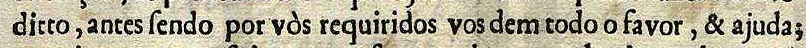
ditto, antes sendo por vòs requiridos vos dem todo o favor, & ajuda;
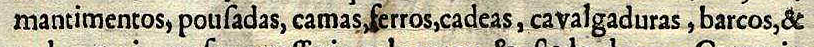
mantimentos, pousadas, camas, ferros, cadeas, cavalgaduras, barcos, &
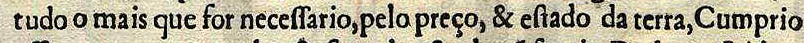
tudo o mais que for necessario, pelo preço, & estado da terra, Cumprio
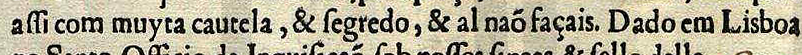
assi com muyta cautela, & segredo, & al naõ façais. Dado em Lisboa
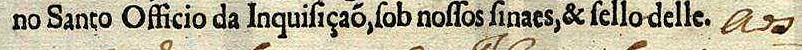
no Santo Officio da Inquisiçaõ, sob nossos sinaes, & sello delle. aos
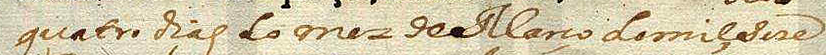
quatro dias do mez de Março de mil, sete
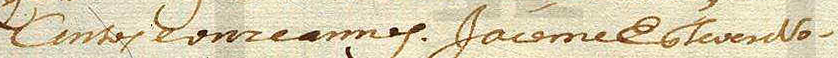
Centos e onze annos. Jacome Esteves No
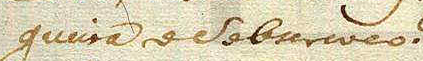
gueira o Sobscreveo.
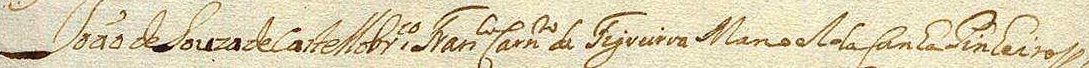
Ioão de Souza de Castelbr.co Fran.co Carn.ro de Figueiroa Manoel da Cunha Pinheiro
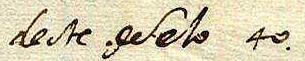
deste selo 40.
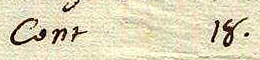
cont 18.
